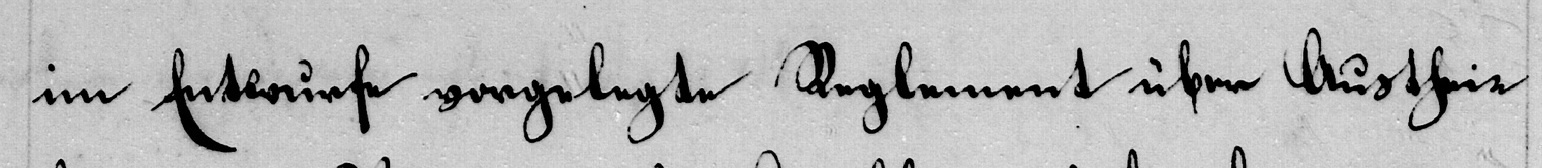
im Entwurfe vorgelegte Reglement über Austhei¬
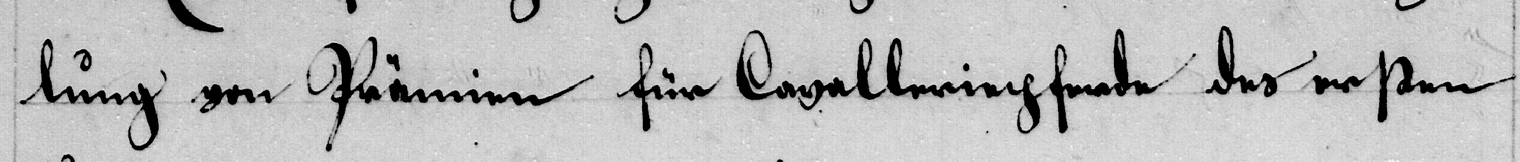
lung von Prämien für Cavalleriepferde des ersten
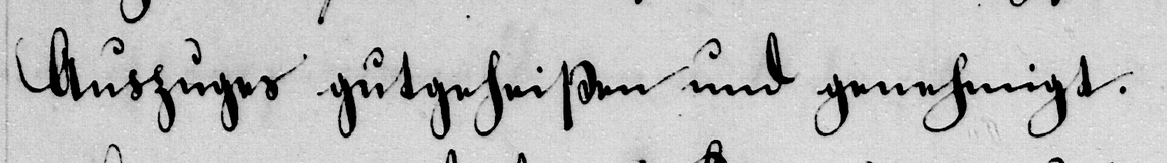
Auszuges gutgeheißen und genehmigt.
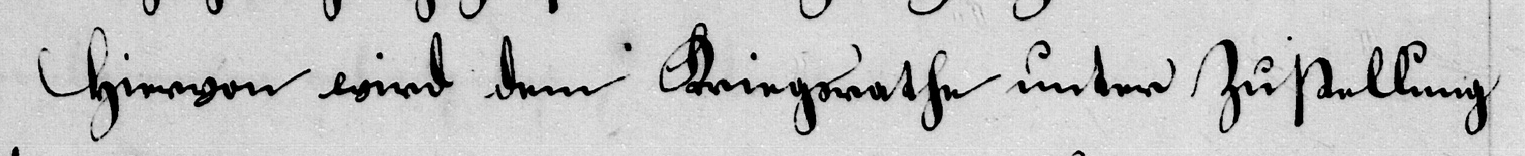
Hiervon wird dem Kriegsrathe unter Zustellung
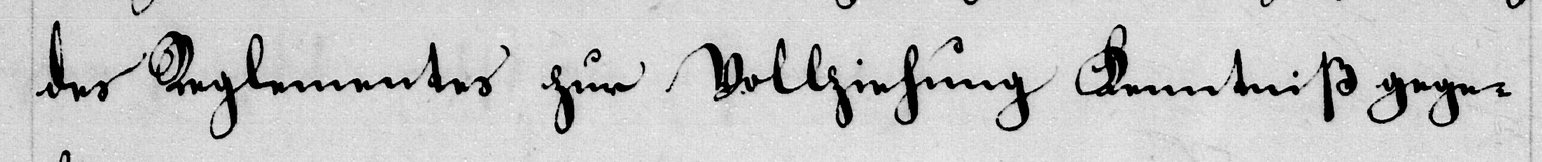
des Reglementes zur Vollziehung Kenntniß gege¬
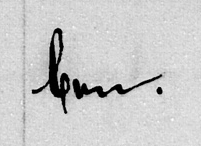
ben.
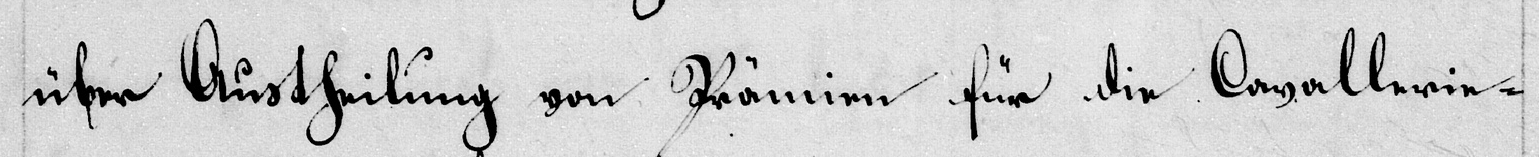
über Austheilung von Prämien für die Cavalleri¬
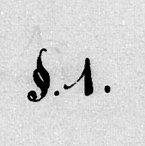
§. 1.
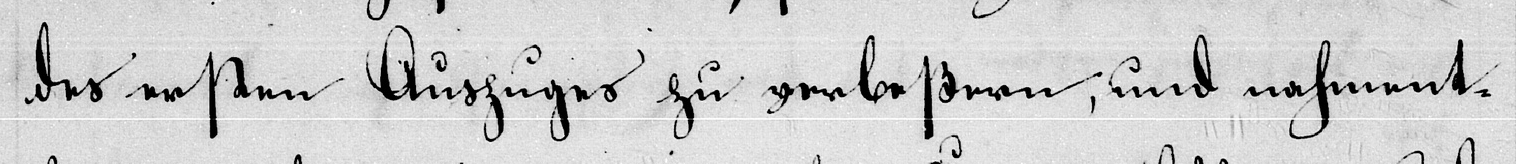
des ersten Auszuges zu verbeßern, und nahment¬
